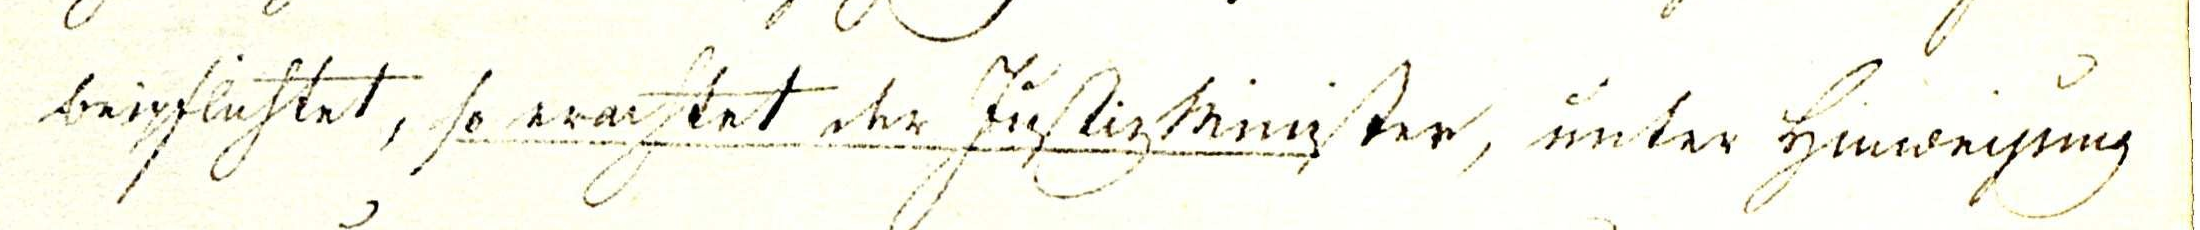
beipflichtet, so erachtet der Justizminister, unter Hinweisung
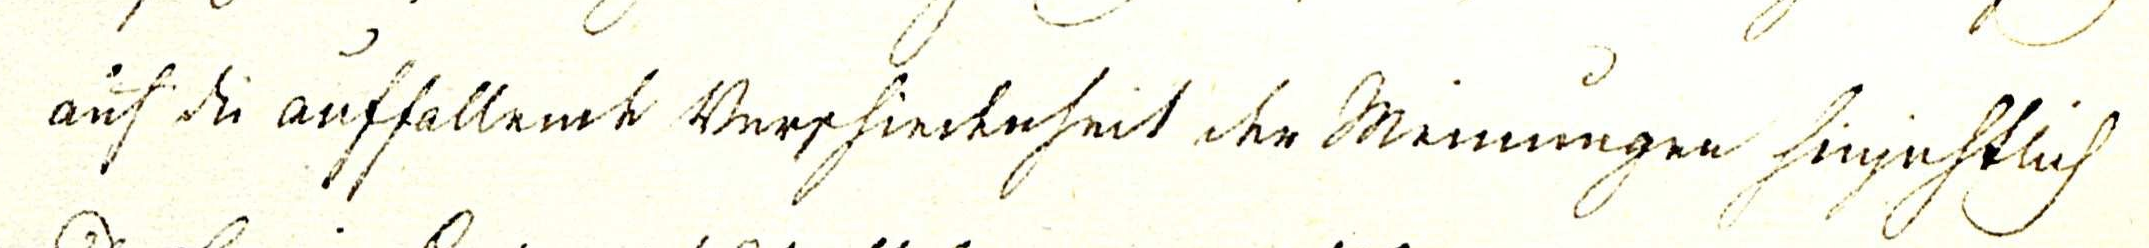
auf die auffallende Vershiedenheit der Meinungen hinsichtlich
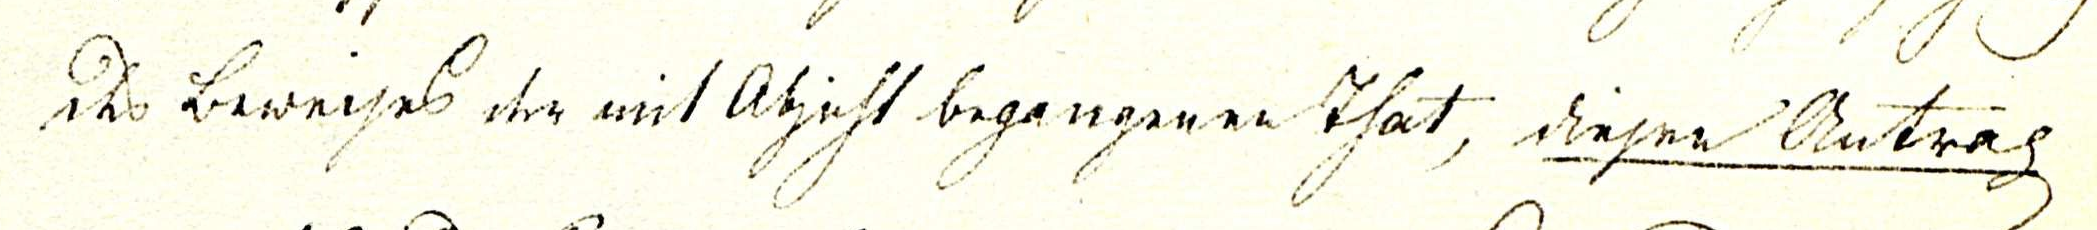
des Beweises der mit Absicht begangenen That, dieser Antrag
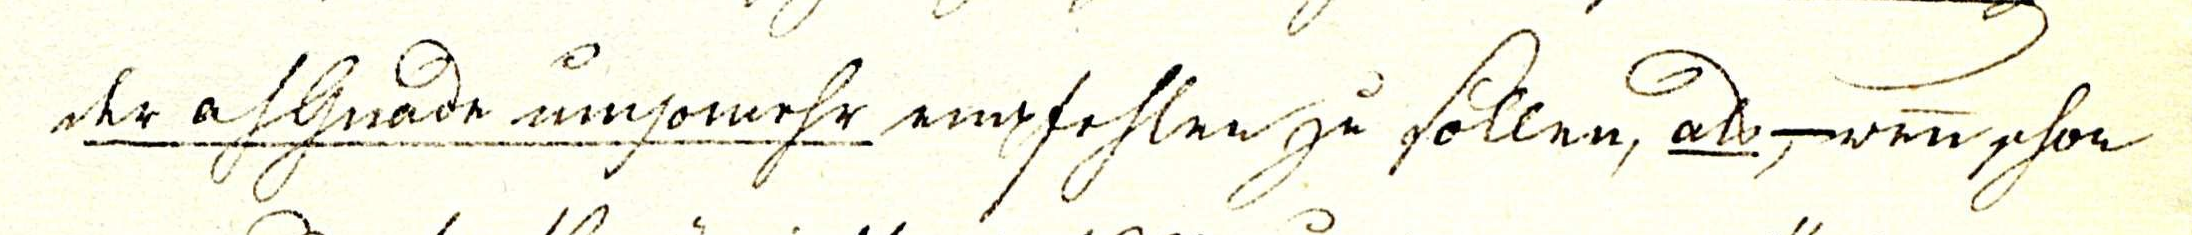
der ah Gnade umsomehr empfohlen zu sollen, als, - wenn schon
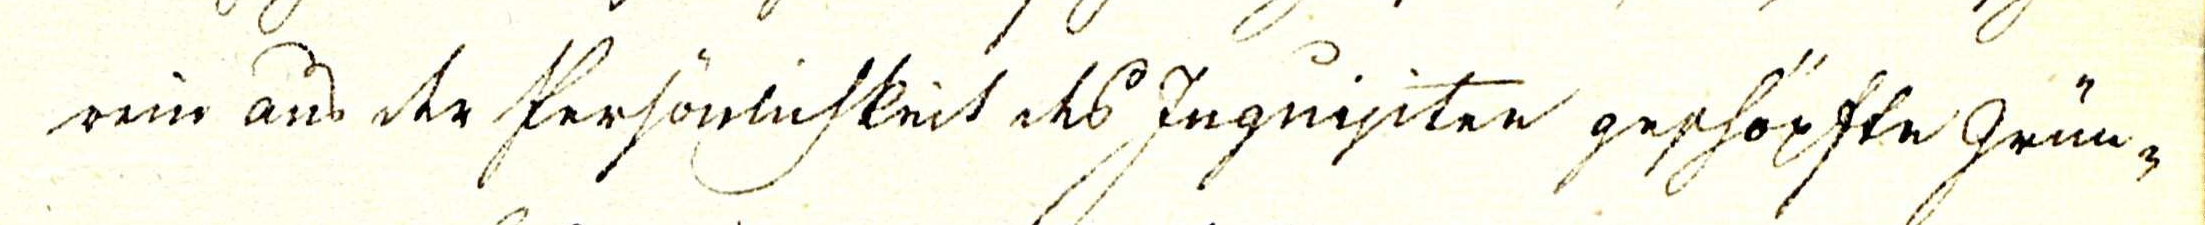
rein aus der Persönlichkeit des Inquisiten geschöpfte Grün¬
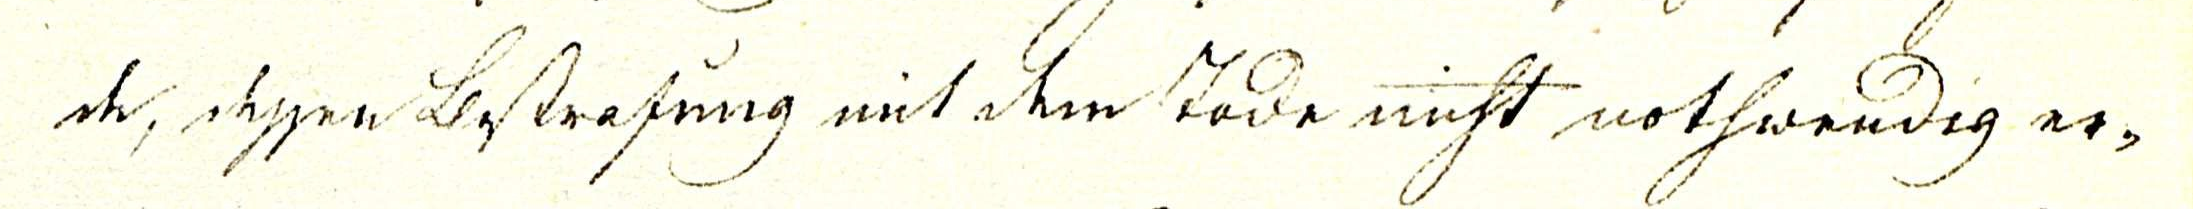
de, dessen Bestrafung mit dem Tode nicht notwendig er¬
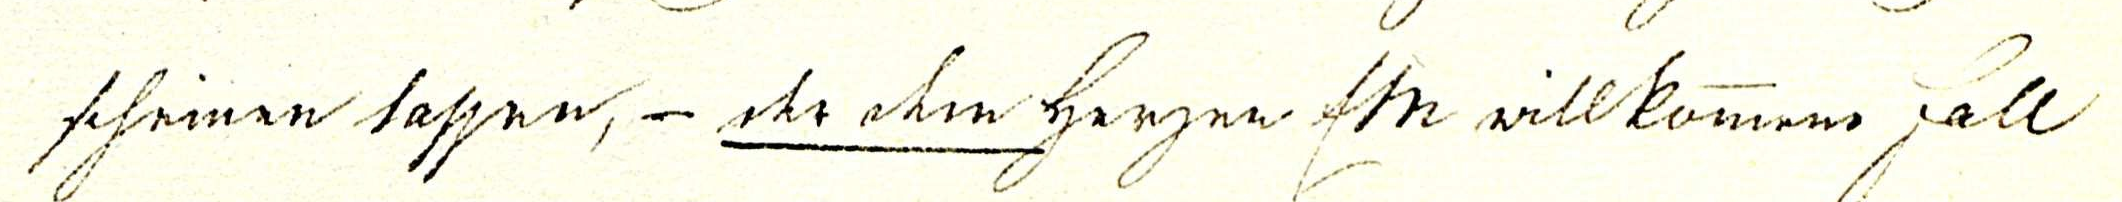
scheinen lassen, - der dem Herzen EM willkommene Fall
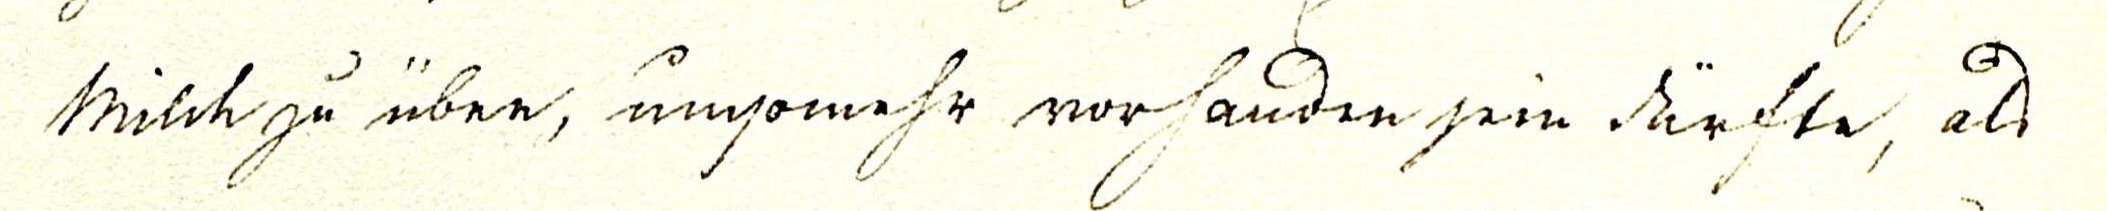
Milch zu über, umsomehr vorhanden sein dürfte, als
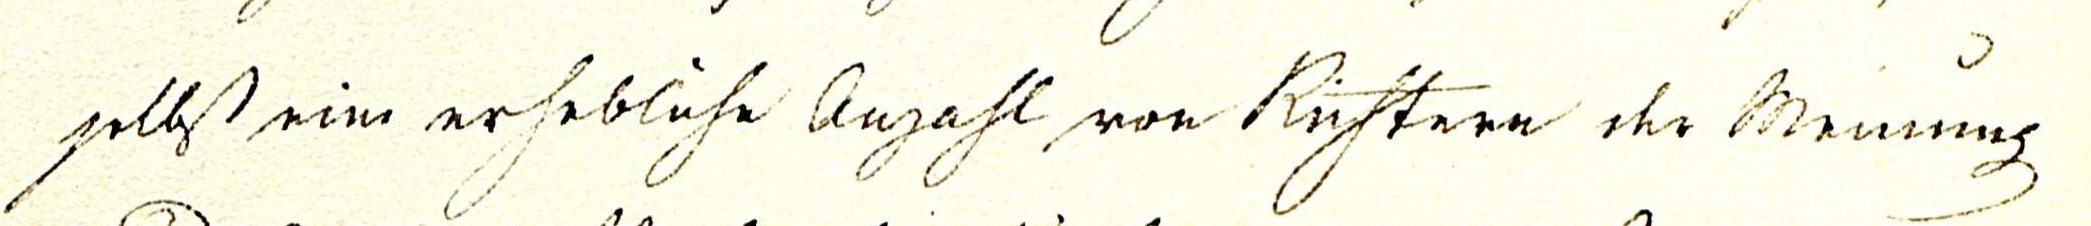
selbst ein erhebliche Anzahl von Richtern der Meinung
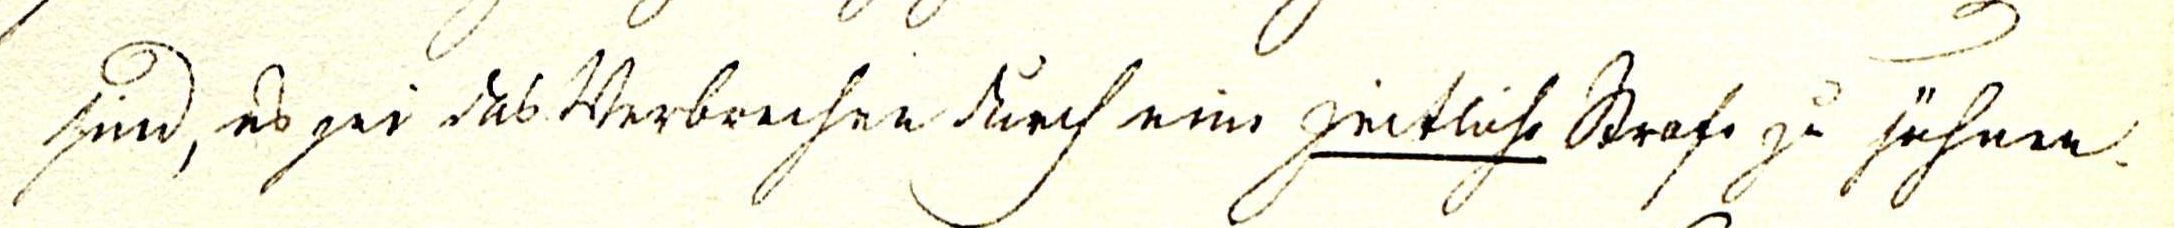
sind, es sei das Verbrechen durch eine zeitliche Strafe zu sühnen.
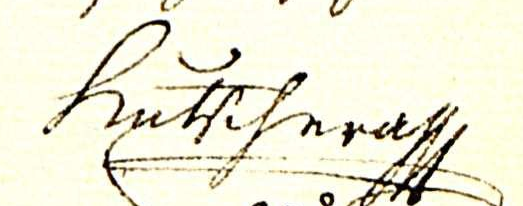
Kutschera
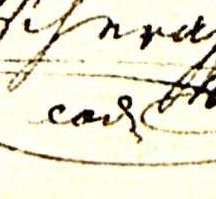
cod.
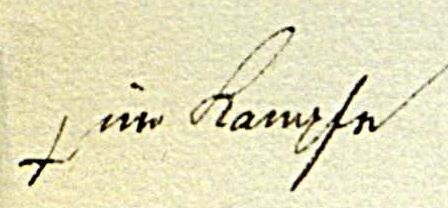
im Kampfe
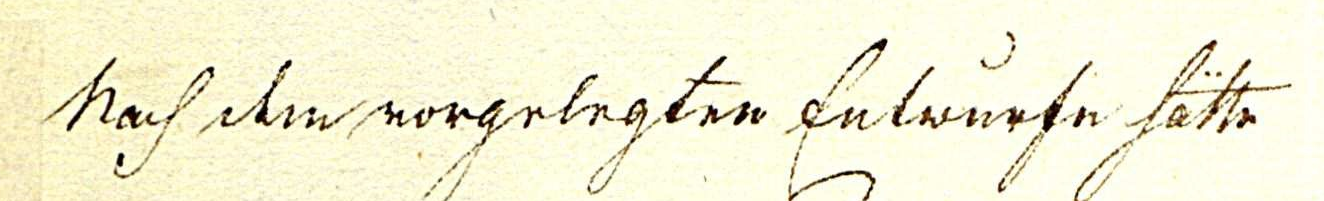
Nach dem vorgelegten Entwurfe hätte
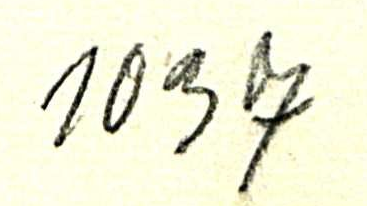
1037
